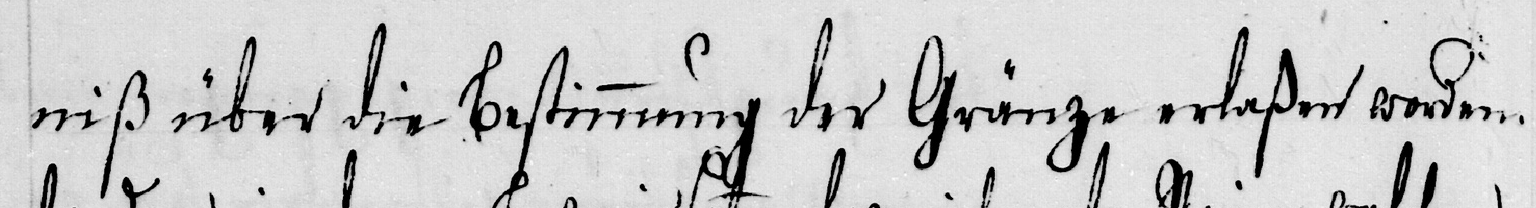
niß über die Bestimmung der Gränze erlaßen worden.
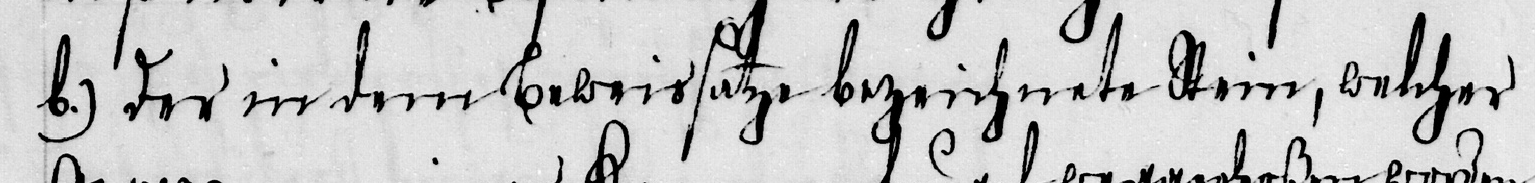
b.) Der in dem Beweissatze bezeichnete Stein, welcher
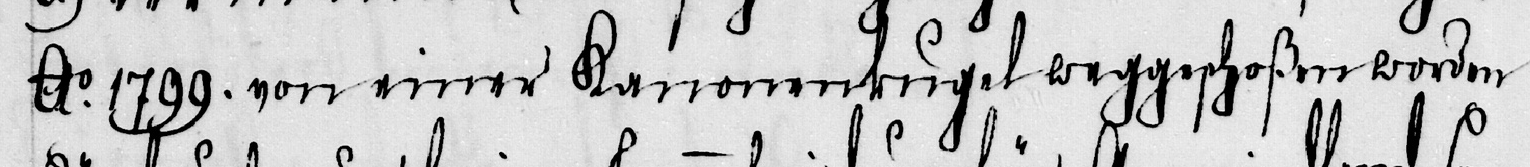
Ao. 1799. von einer Kanonenkugel weggeschoßen worden
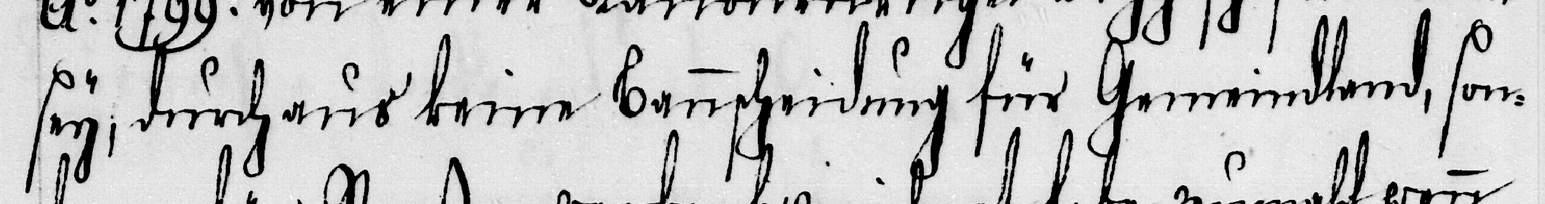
sey, durchaus keine Bannscheidung für Gemeindland, son¬
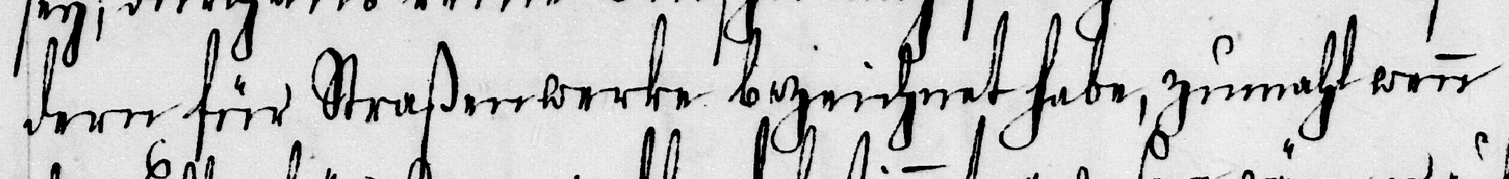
dern für Straßenwerke bezeichnet habe, zumahl wenn
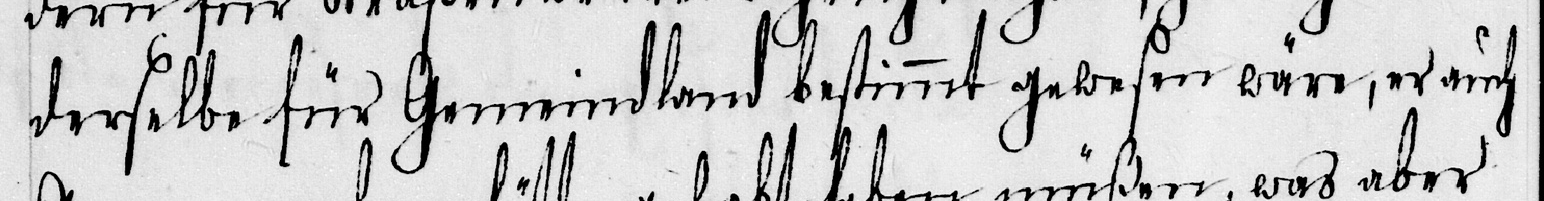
derselbe für Gemeindland bestimmt gewesen wäre, er auch
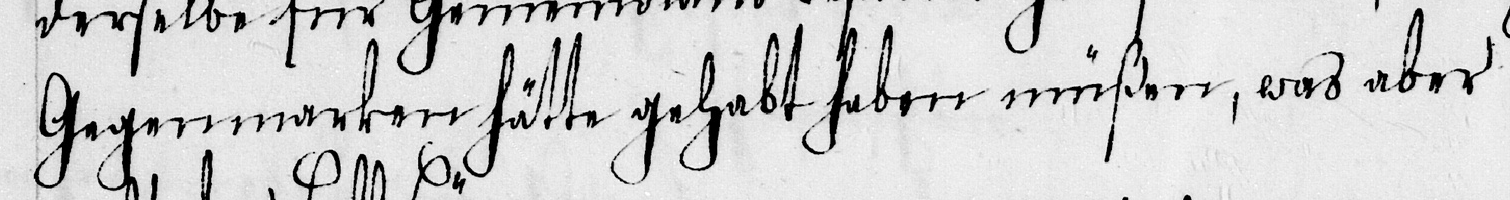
Gegenmarken hätte gehabt haben müßen, was aber
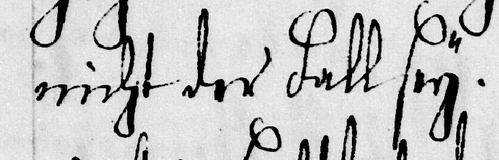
nicht der Fall sey.
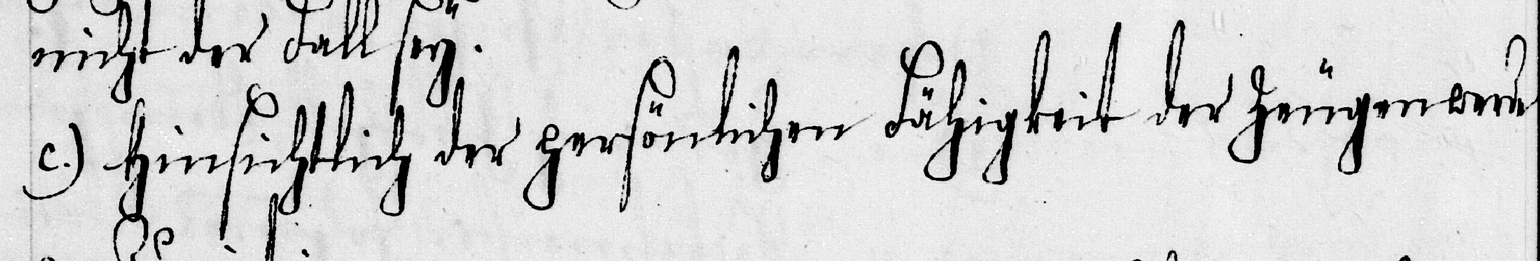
c.) Hinsichtlich der persönlichen Fähigkeit der Zeugen wer¬
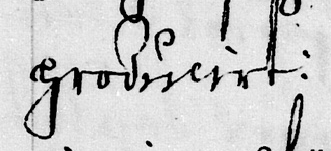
producirt:
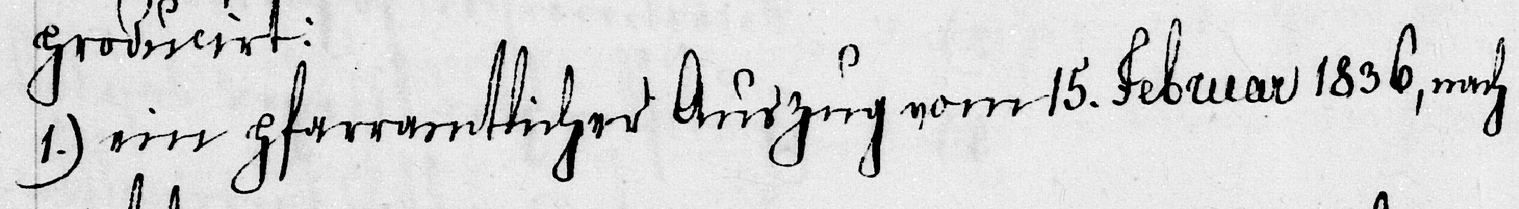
1.) ein pfarramtlicher Auszug vom 15. Februar 1836, nach
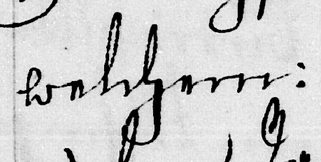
welchem:
